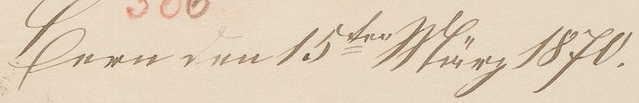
Bern den 15ten März 1870.
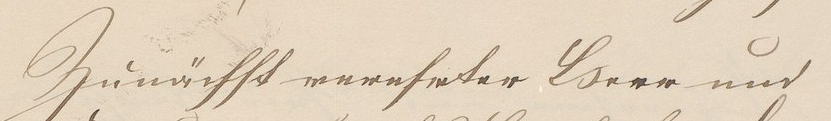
Zunächst verehrter Herr und
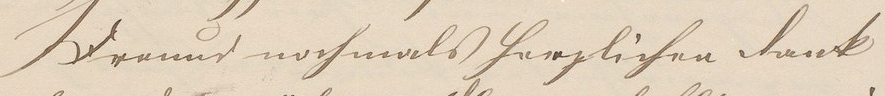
Freund nochmals herzlichen Dank
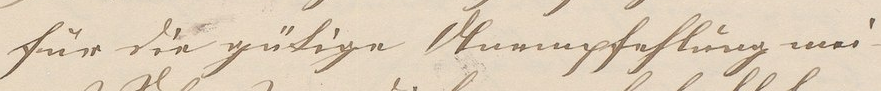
für die gütige Anempfehlung mei-
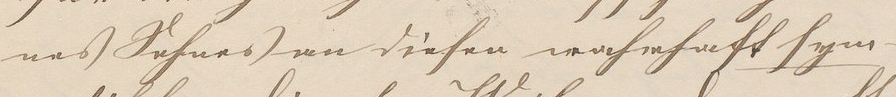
nes Sohnes an diesen wahrhaft sym-
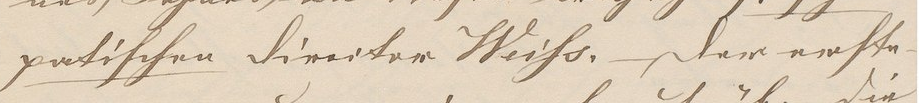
patischen Director Weiss. – Der erste-
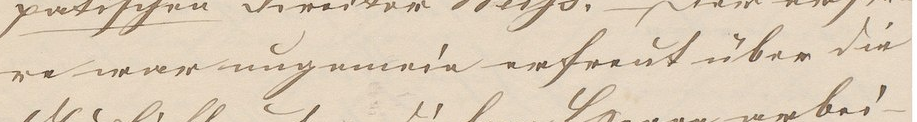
re war ungemein erfreut über die
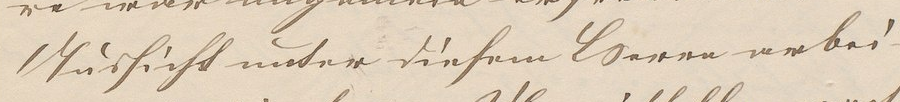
Aussicht unter diesem Herrn arbei-
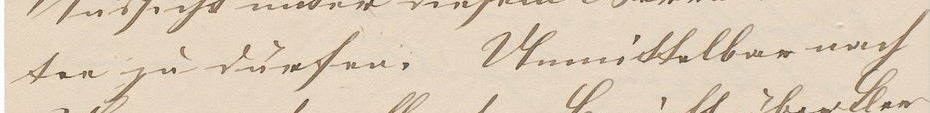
ten zu dürfen. Unmittelbar nach
